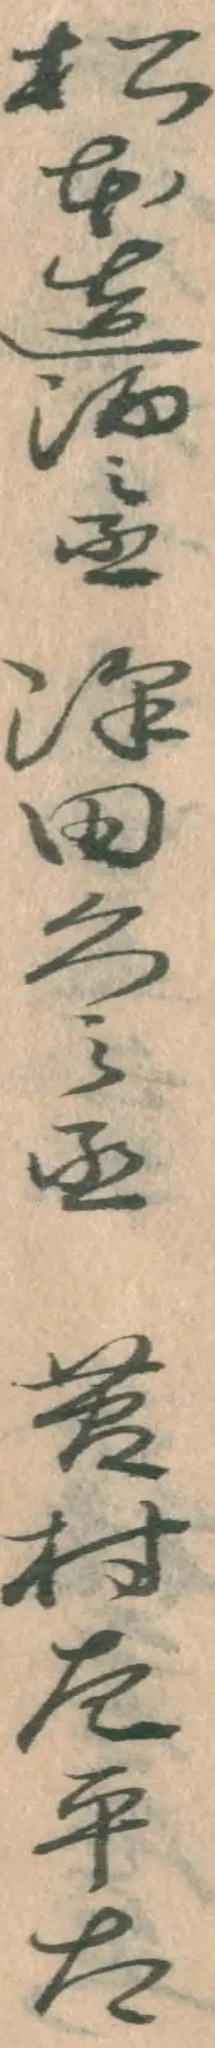松本造酒之丞沢田久之丞菅村左平太
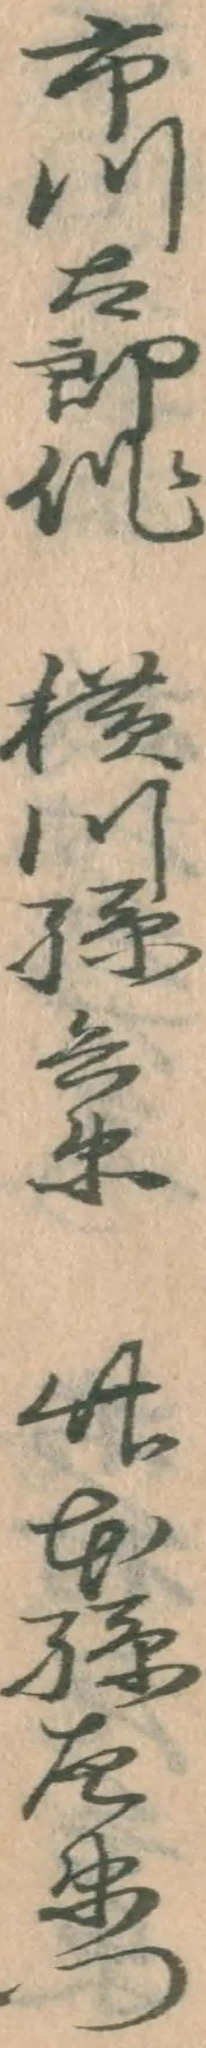市川太郎作横川孫兵衛竹本孫左衛門
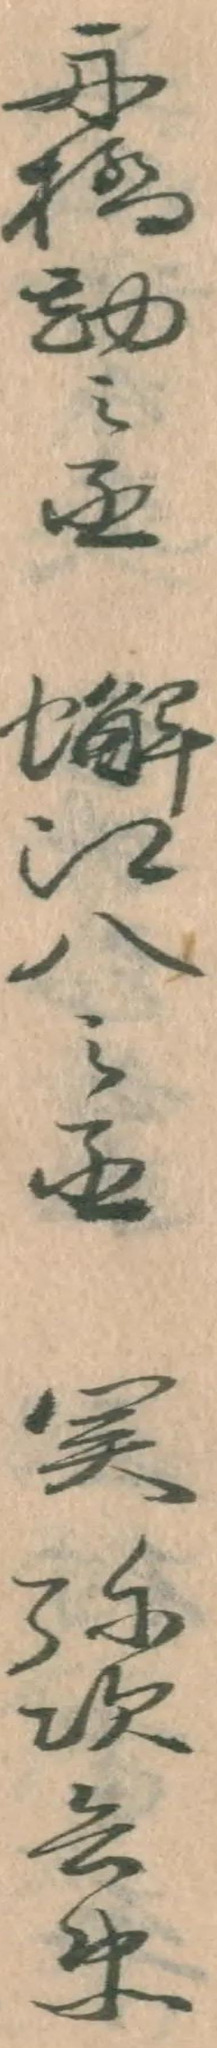舟橋干之丞蠏江八之丞関弥次兵衛
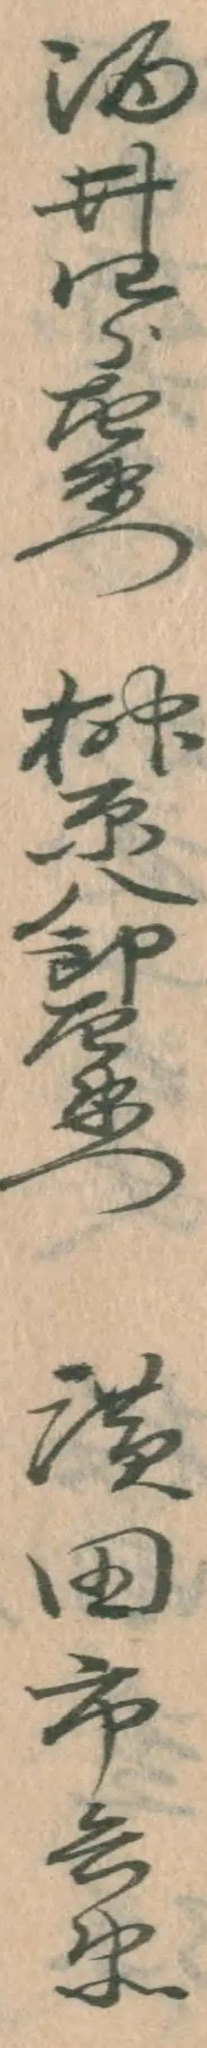酒井四郎左衛門榊原八郎左衛門廣田市兵衛
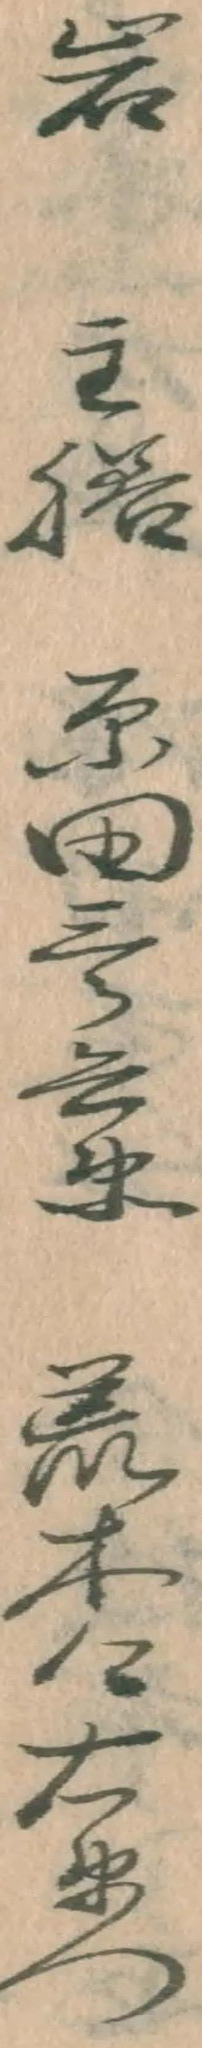岩主膳原田三郎兵衛荒木郷右衛門
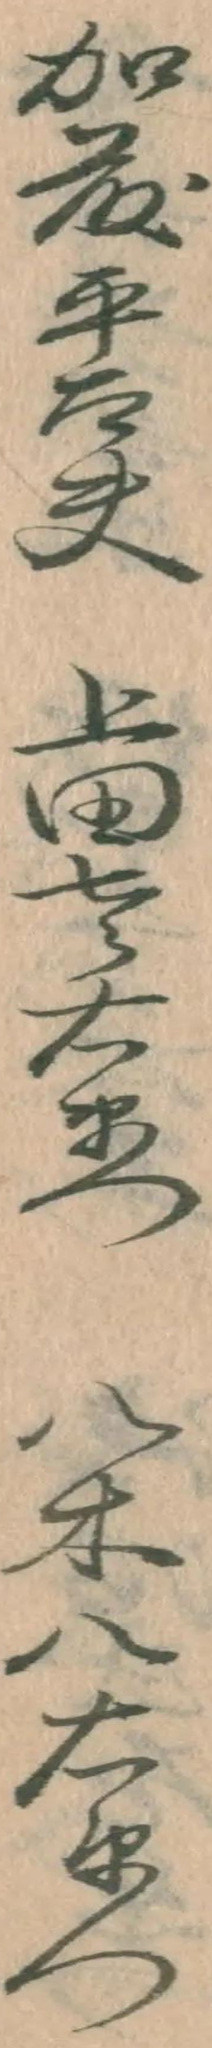加藤平太夫上田七郎右衛門八木八右衛門
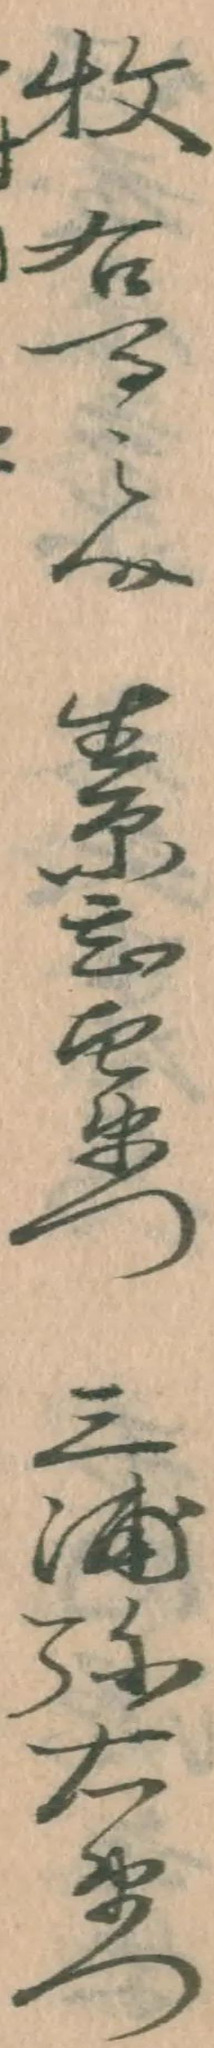牧右馬之介生原甚左衛門三浦弥右衛門
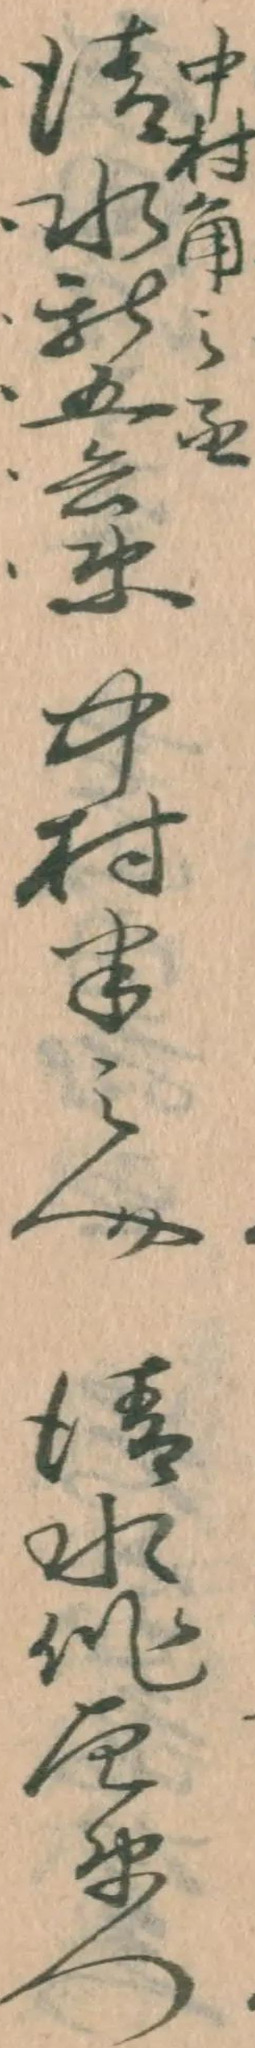清水新五兵衛中村半之介清水作左衛門
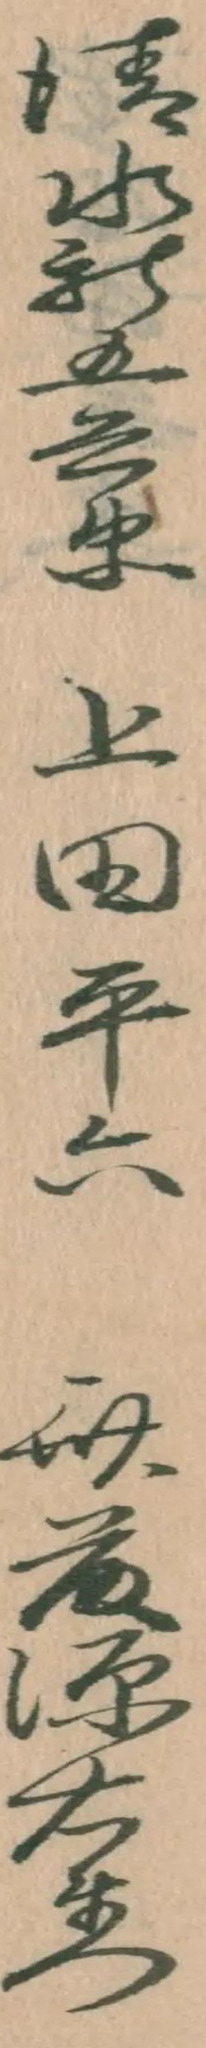清水信五兵衛上田平六斎藤源右衛門
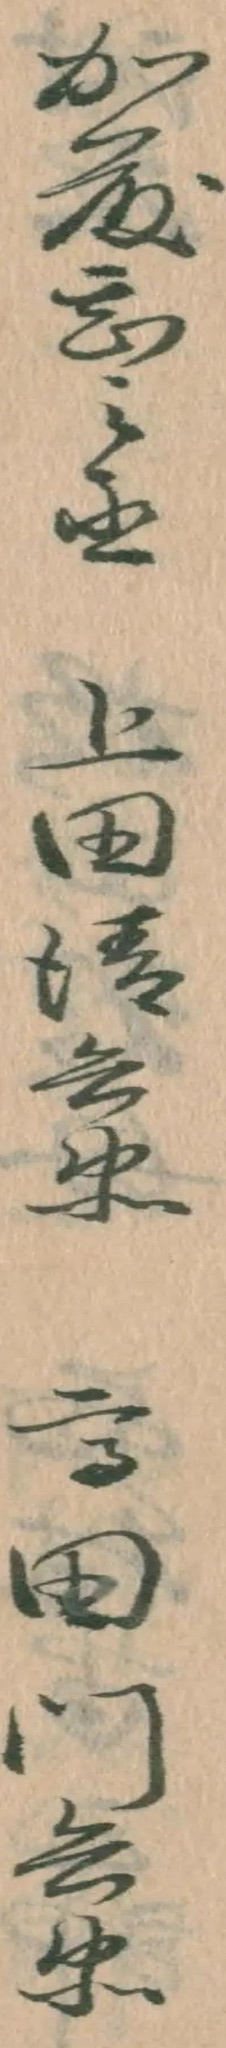加藤甚之丞上田清兵衛高田門兵衛
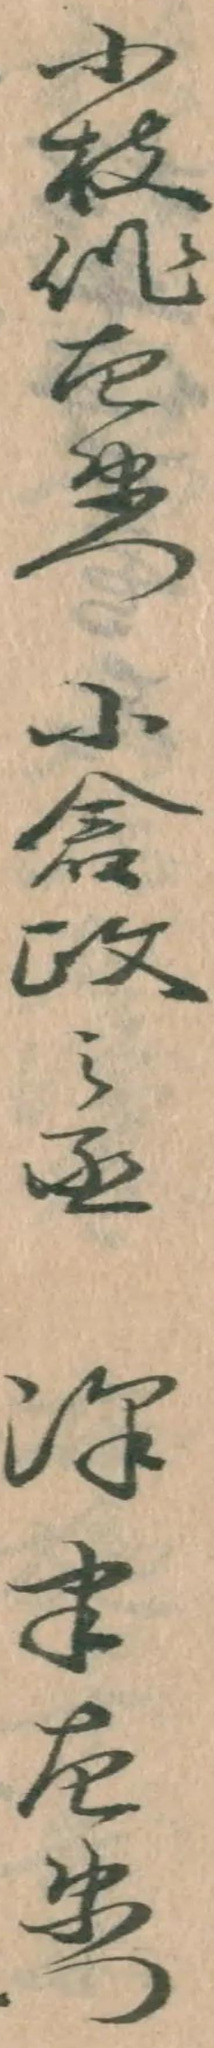小枝作左衛門小倉政之丞沢半左衛門
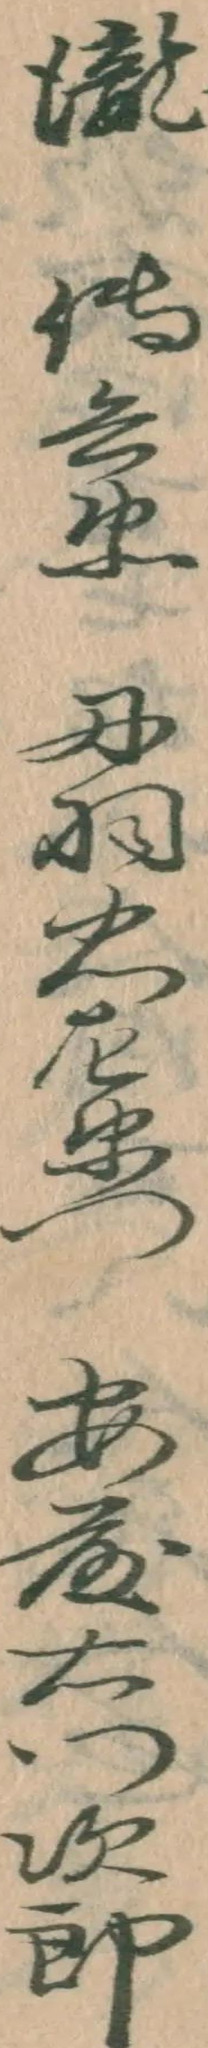瀧伝兵衛丹羽忠左衛門安藤右門次郎
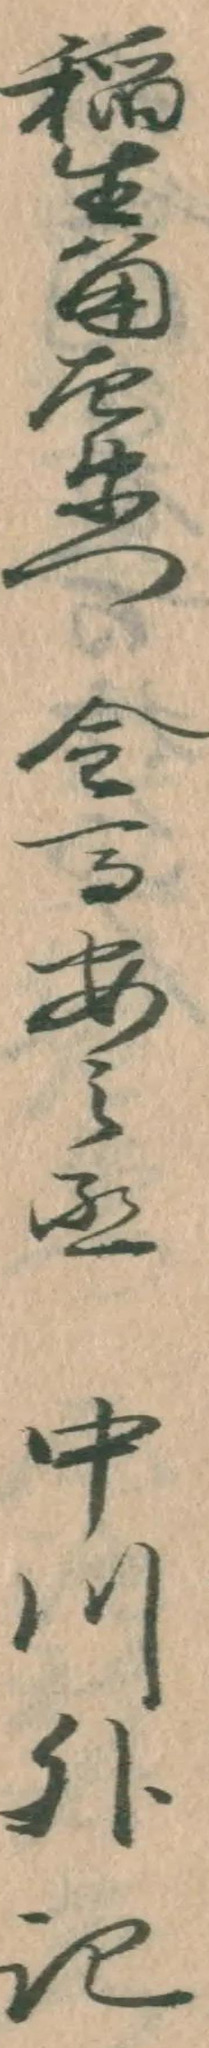稲生角左衛門金馬安之丞中川外記
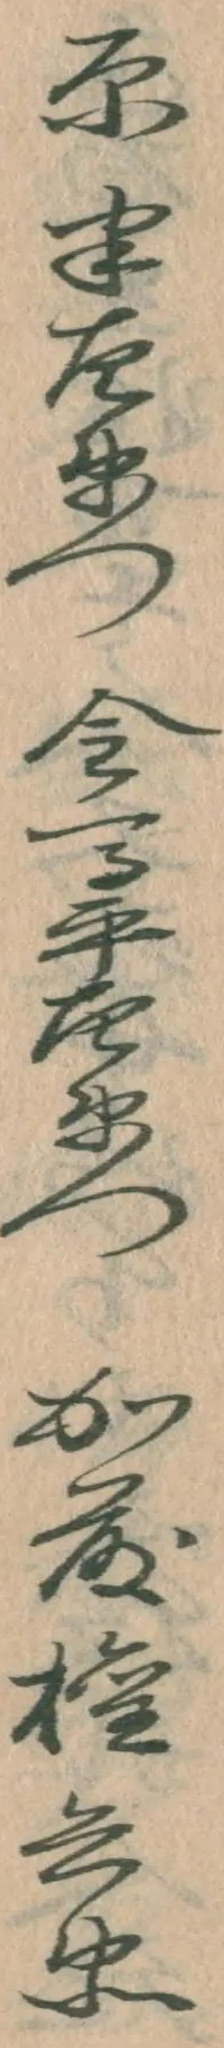原半左衛門金馬平左衛門加藤権兵衛
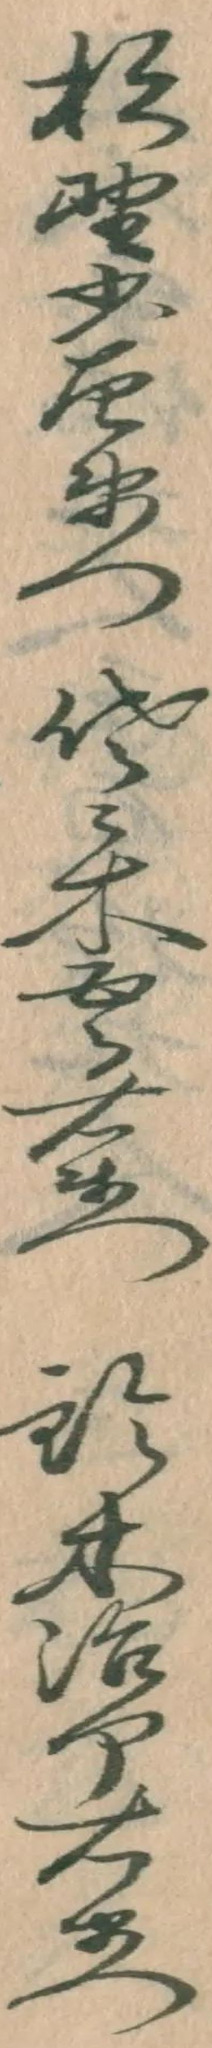杉野少左衛門佐々木五郎左衛門鈴木治部右衛門
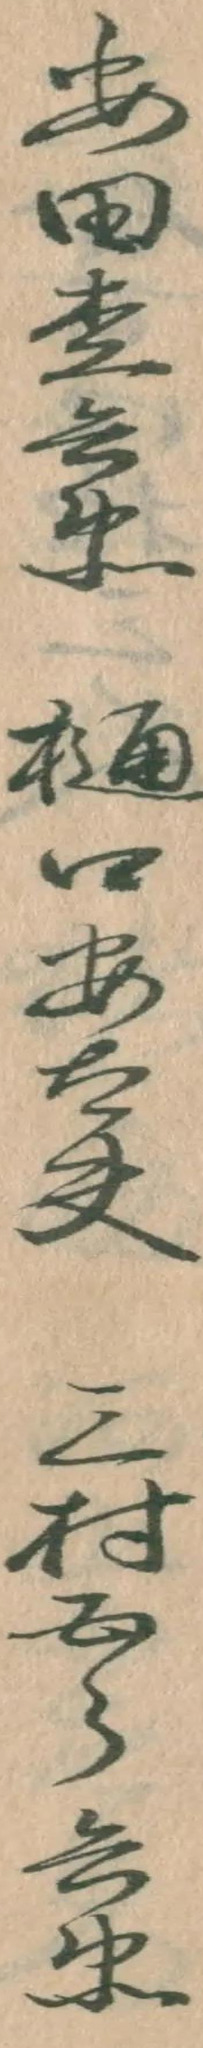安田杢兵衛樋口安太夫三村五郎兵衛
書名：切支丹御退治記 49巻. [9]
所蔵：国立国会図書館 National Diet Library, JAPAN
